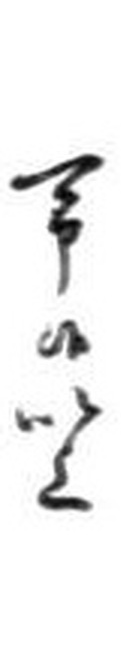可申候以上
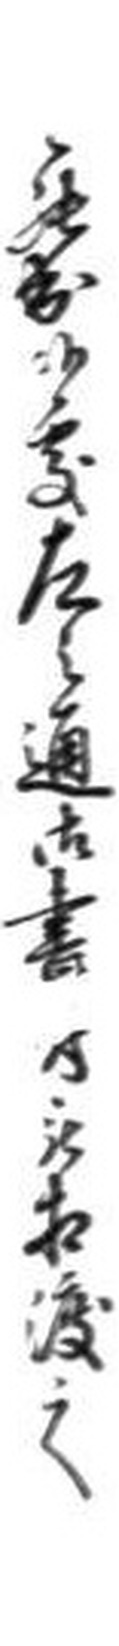罷出候処左之通御書付被相渡之

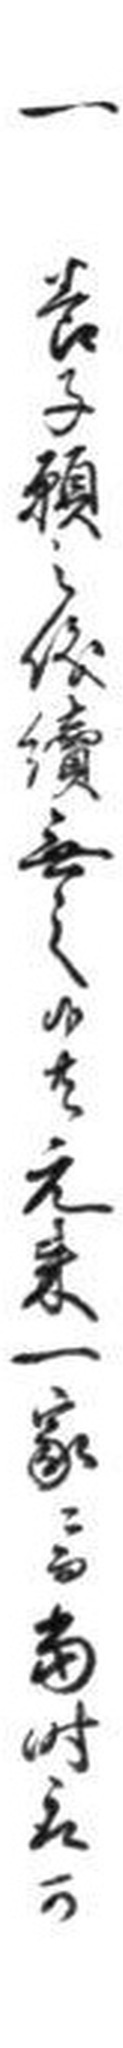一養子願之儀続無之候共元来一家ニ而当時取か
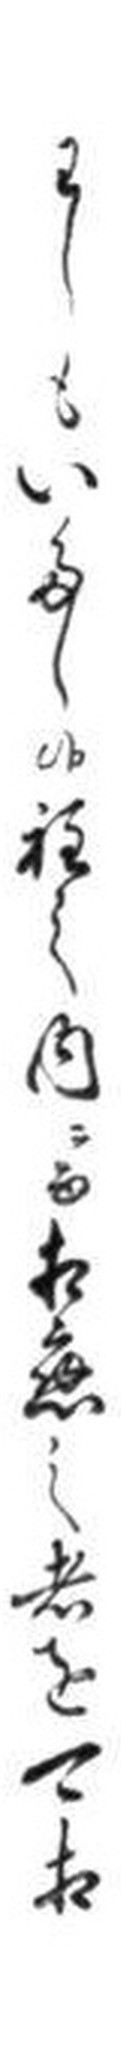わしもいたし候程之内ニ而相応之者を可相
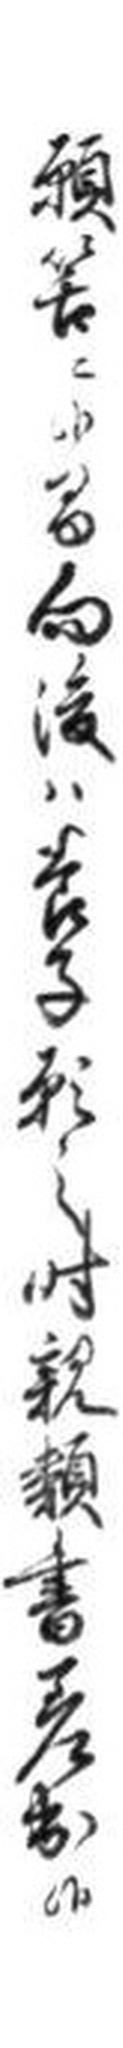願筈ニ候間向後ハ養子願之時親類書差出候
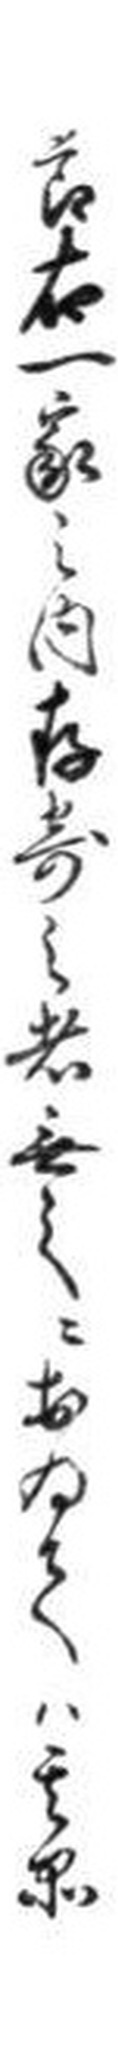節右一家之内存寄之者無之ニおゐてハ其品
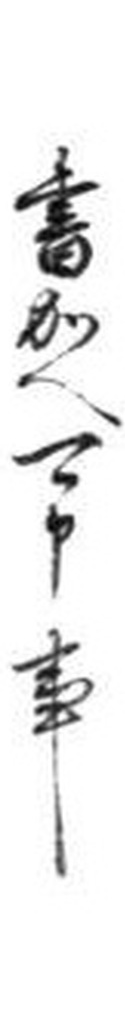書加へ可申事
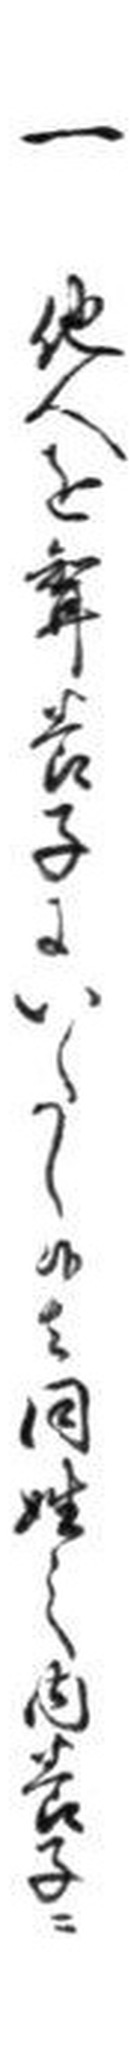一他人を婿養子にいたし候者同姓之内養子ニ
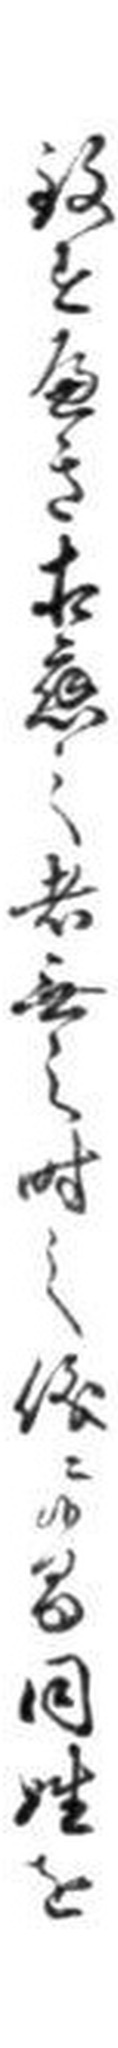致すへき相応之者無之時之儀ニ候間同姓を
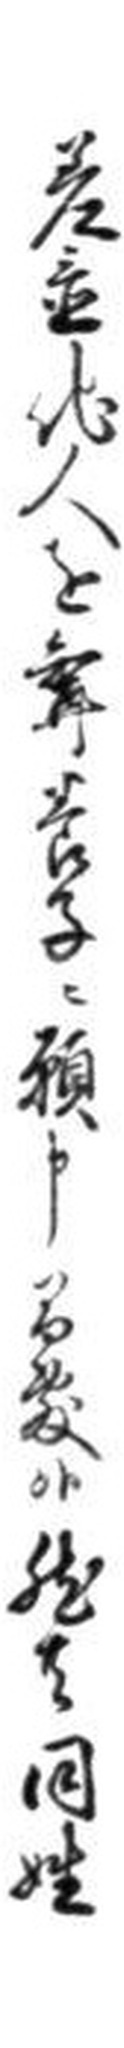差置他人を婿養子ニ願申間敷候然共同姓
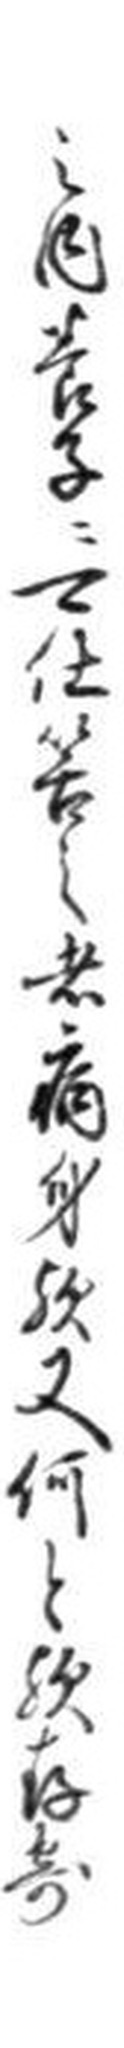之内養子ニ可仕筈之者病身歟又何と歟存寄
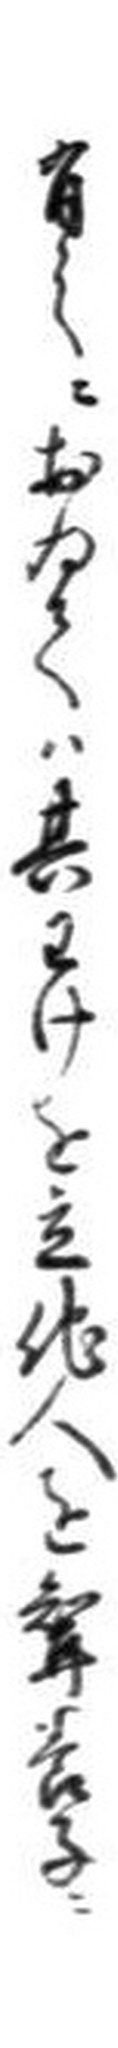有之ニおゐてハ其わけを立他人を婿養子ニ
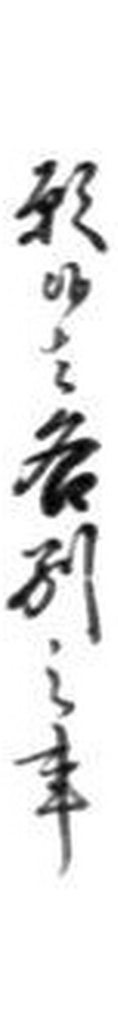願候者各別之事
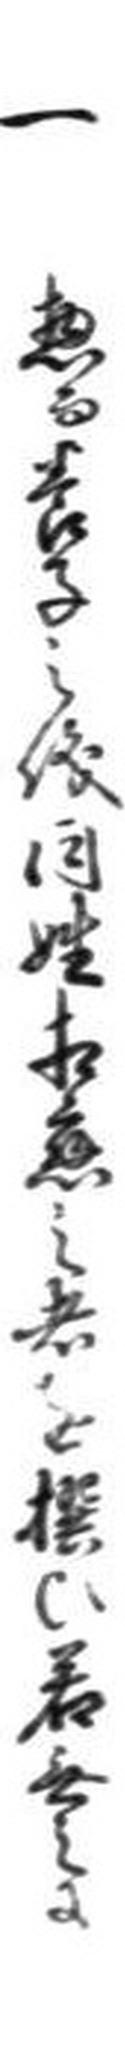一惣而養子之儀同姓相応之者を選ひ若無之に
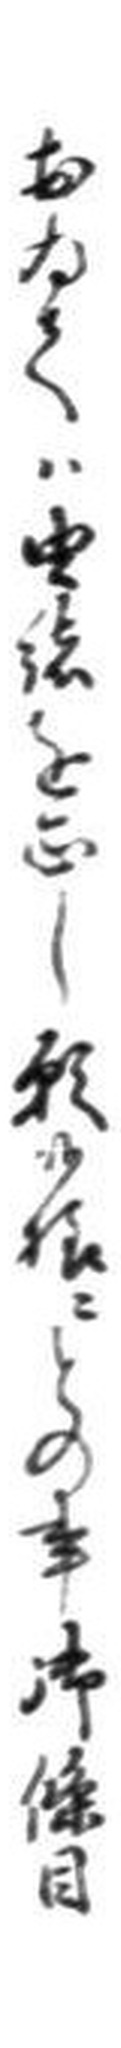おゐてハ由緒を正し願候様ニとの事御条目
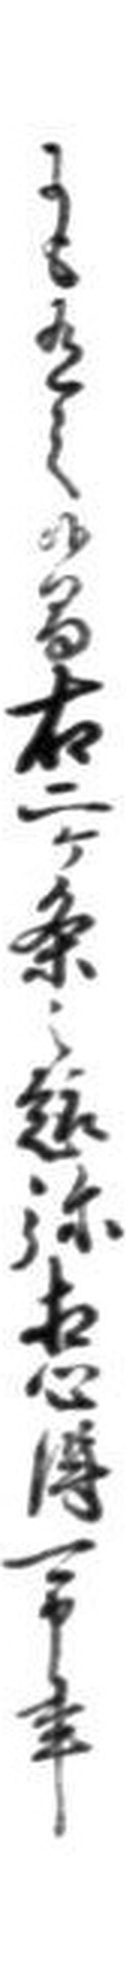にも有之候間右二ケ条之趣弥相心得可申事
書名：家譜 三十三 吉邦公 享保四年
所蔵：福井県文書館 Fukui Prefectural Archives
